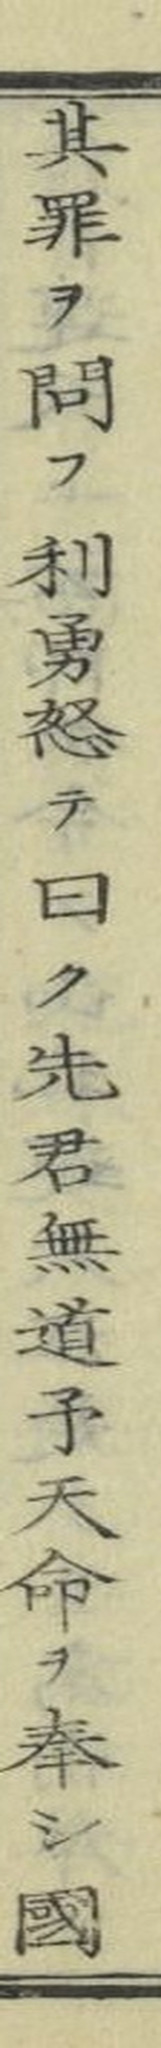其罪ヲ問フ利勇怒テ曰ク先君無道予天命ヲ奉シ國
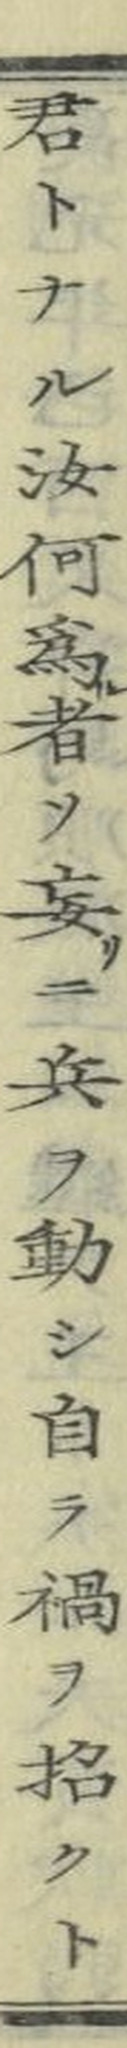君トナル汝何爲者ソ妄ニ兵ヲ動シ自ラ禍ヲ招クト
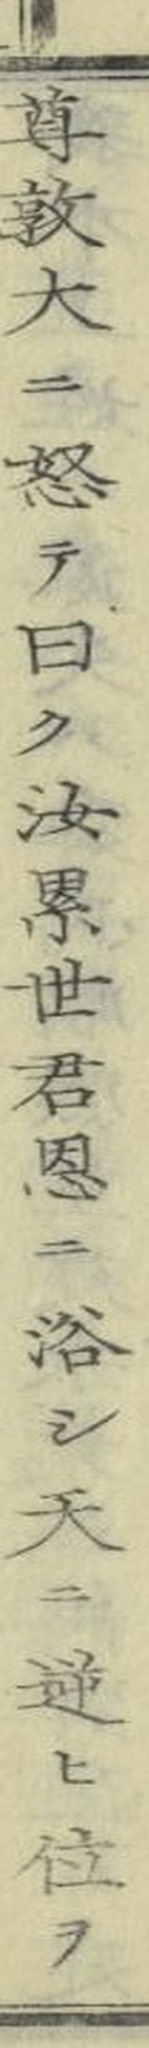尊敦大ニ怒テ曰ク汝累世君恩ニ浴シ天ニ逆ヒ位ヲ
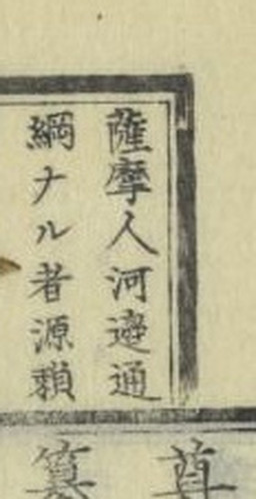薩摩人川邉通
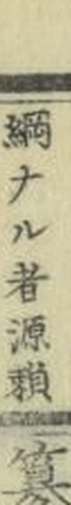綱ナル者源頼
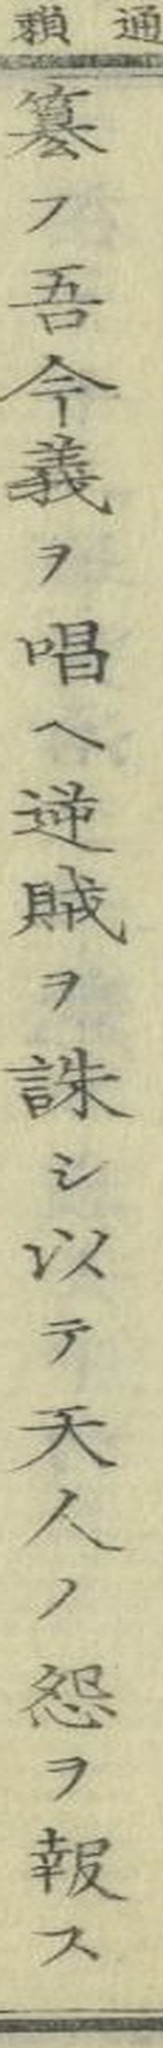簒フ吾今義ヲ唱ヘ逆賊ヲ誅シ以テ天人ニ怨ヲ報ス
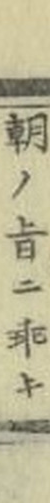朝ノ㫖ニ乖キ
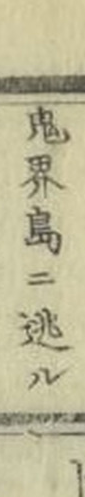鬼界島ニ逃ル
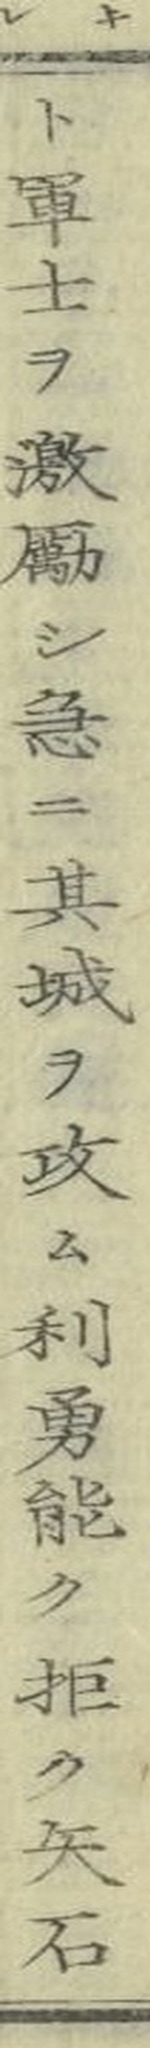ト軍士ヲ激勵シ急ニ其城ヲ攻ム利勇能ク拒ク矢石
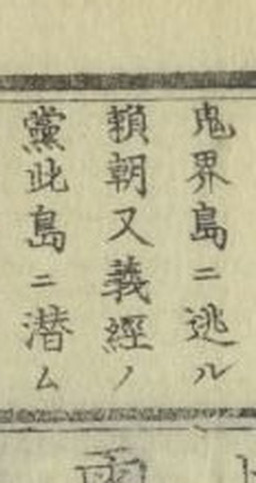頼朝又義経ノ
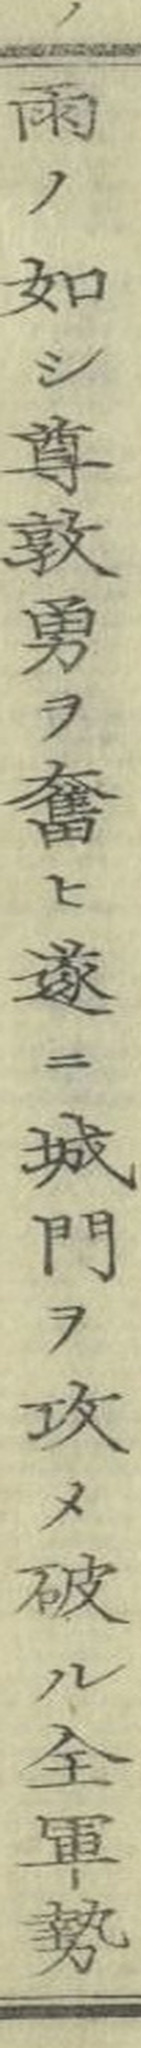雨ノ如シ尊敦勇ヲ奮ヒ遂ニ城門ヲ攻メ破ル全軍勢
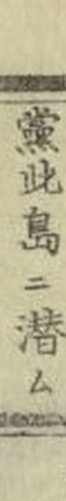黨此島ニ潜ム
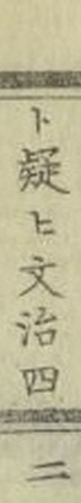ト疑ヒ文治四
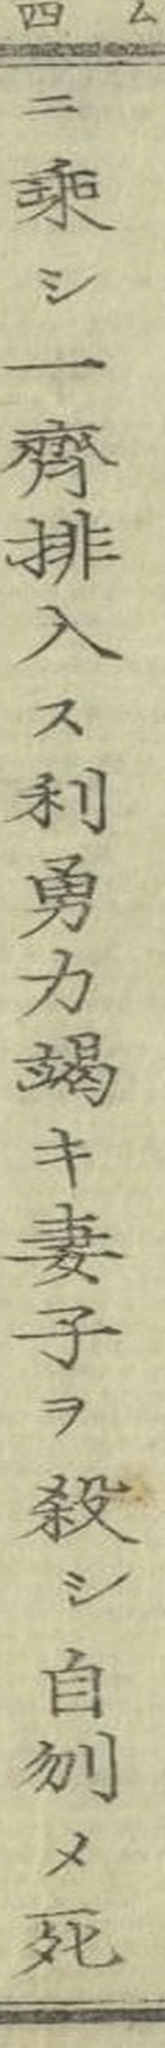ニ乘シ一齊排入ス利勇力竭キ妻子ヲ殺シ自刎シテ死
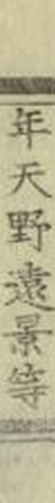年天野遠景等
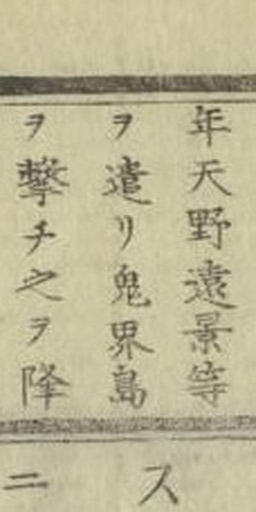ヲ遣リ鬼界島
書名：琉球藩史 一之巻
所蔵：University of the Ryukyus Library
